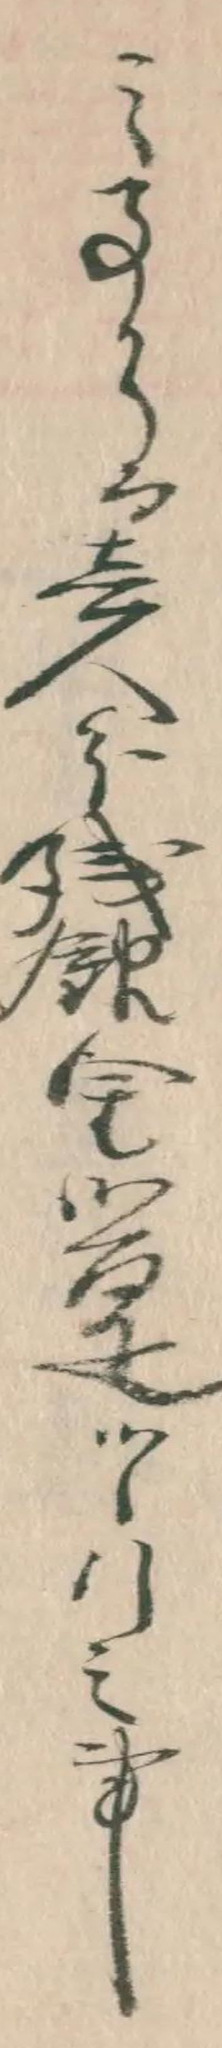之事に而壱人分銭銀金弐百疋ツヽ引之事
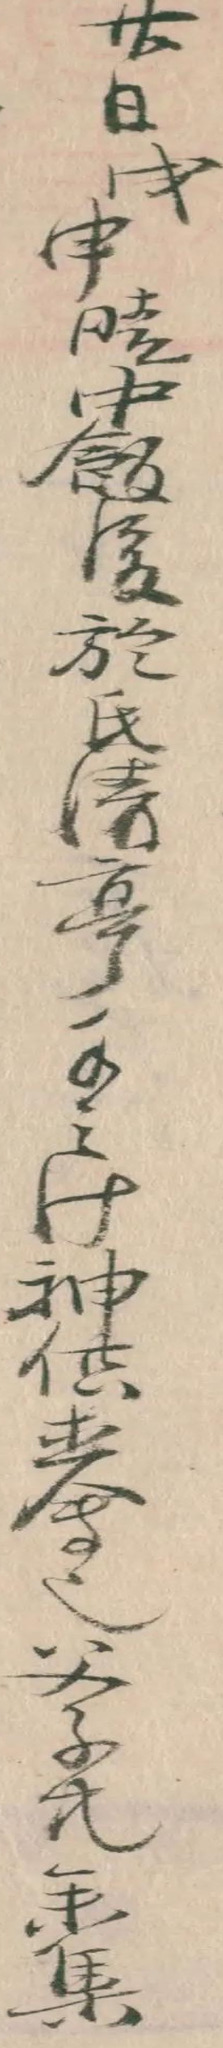廿日戊申晴中飯後於氏清亭再手之汁神供直會也父子共参集
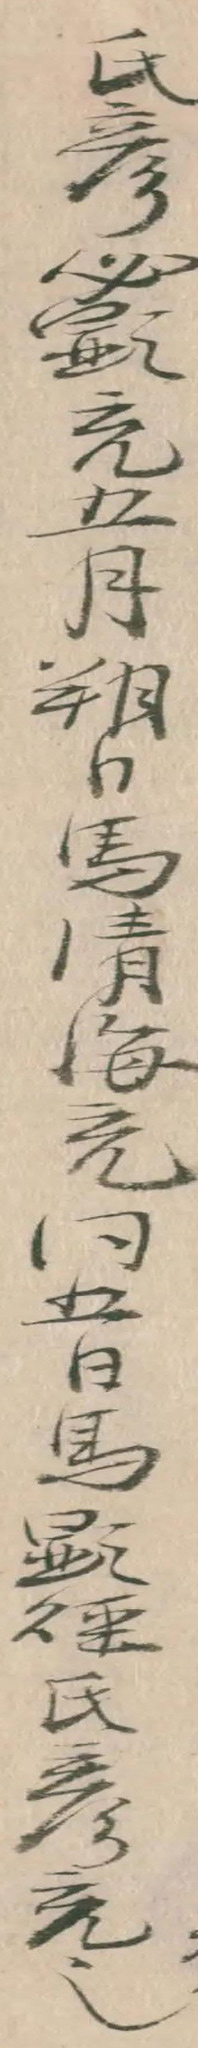氏彦必顕充五月朔日馬清海充同五日馬顕経氏彦充也
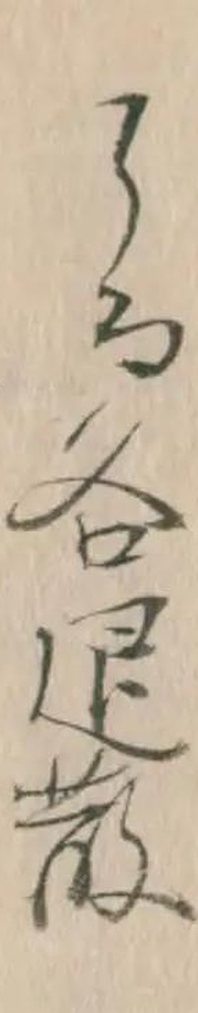了而各退散
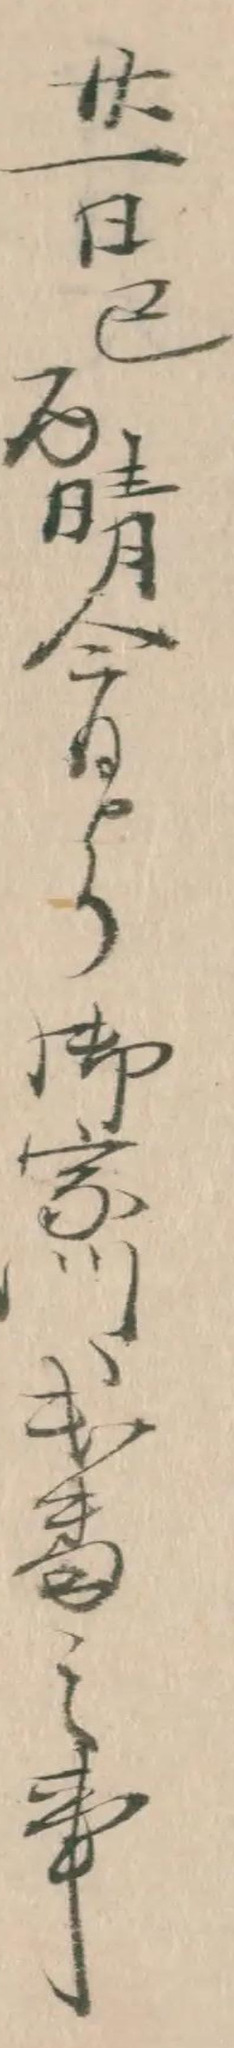廿一日己酉晴今日より御家門へ出番之事
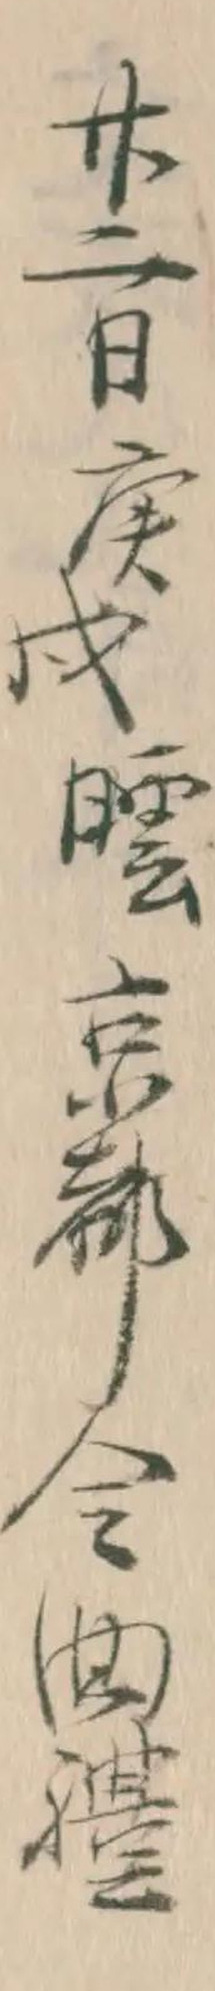廿二日庚戌曇京都令回禮
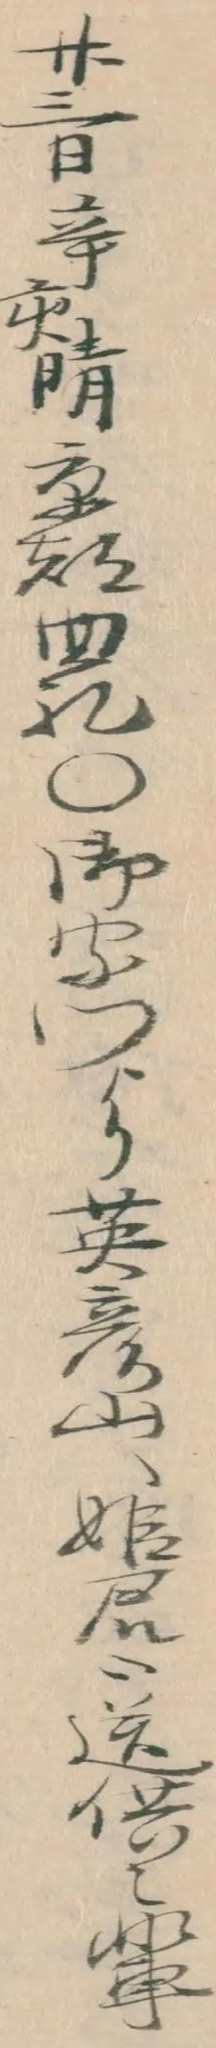廿三日辛亥晴京都回禮○御家門より英彦山へ姫君御送供之輩
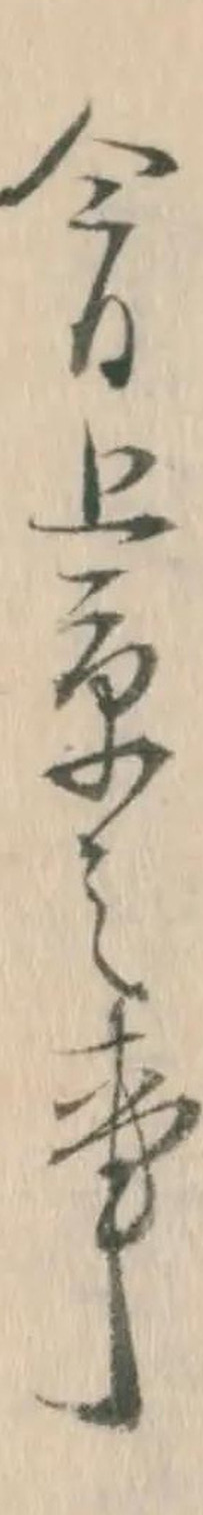今日上京之事
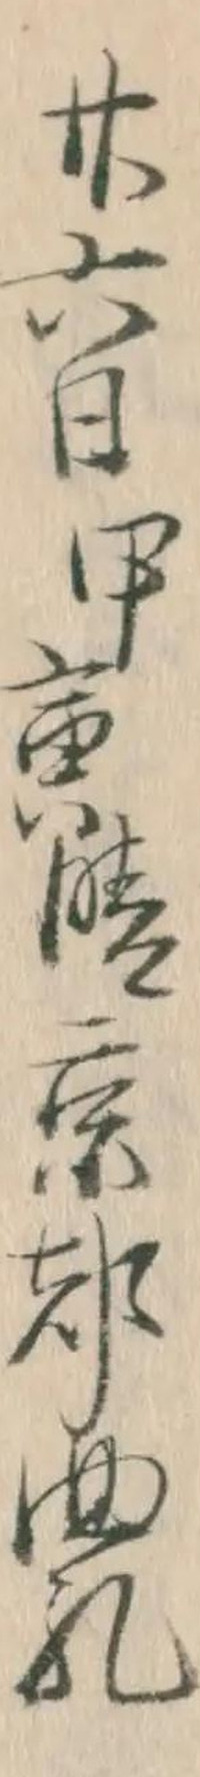廿六日甲寅晴京都回禮
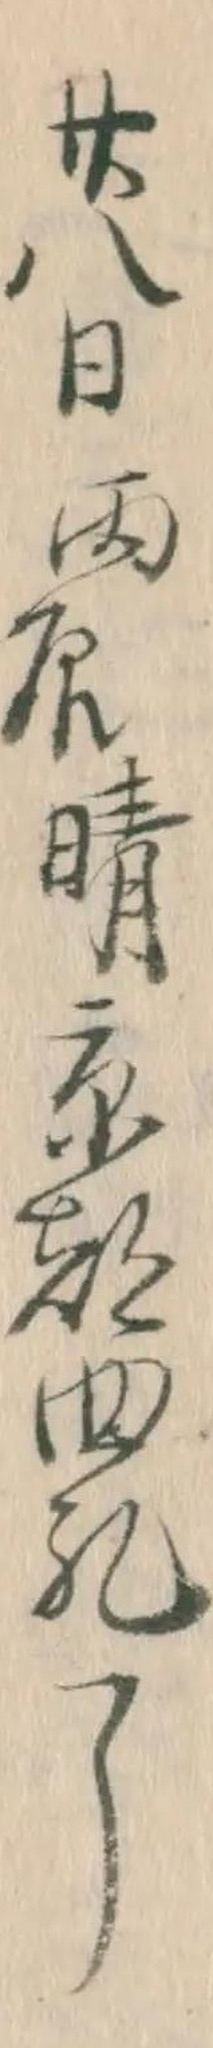廿八日雨辰晴京都回禮了
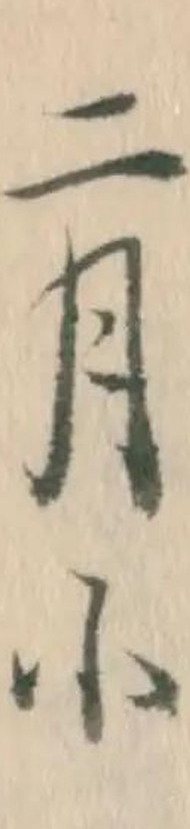二月小
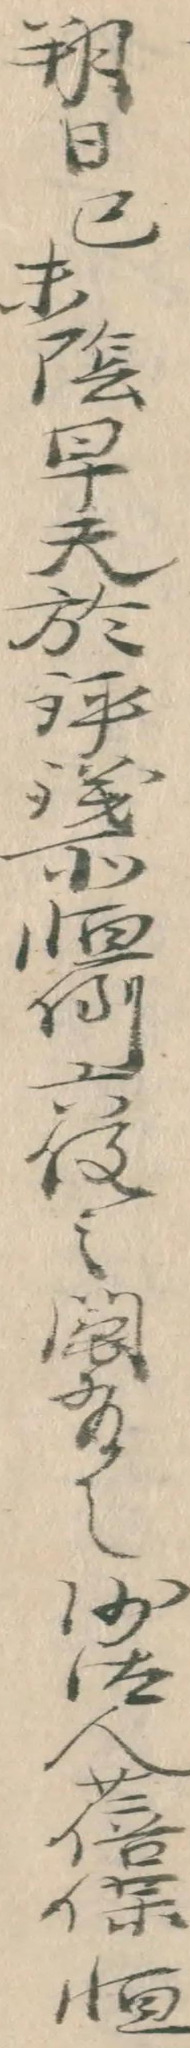朔日已未陰早天於評議所恒例六役之鬮有之沙汰人蓓保恒
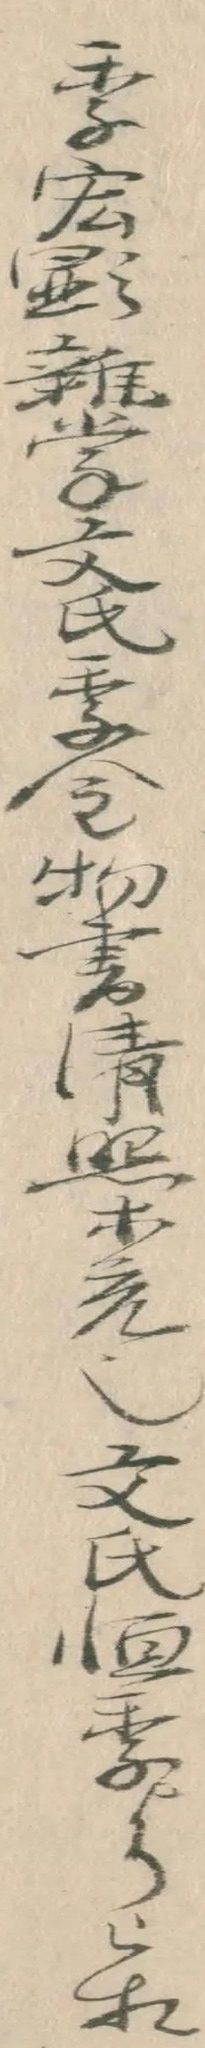季宏顕雑掌文氏季令物書清照等充也文氏恒季より被相
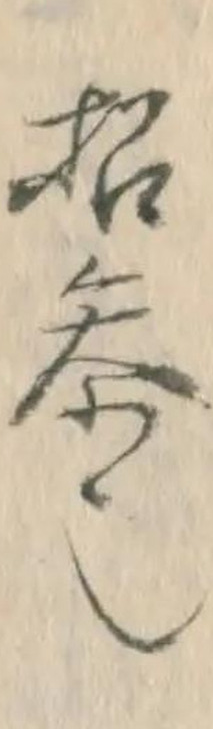招参也
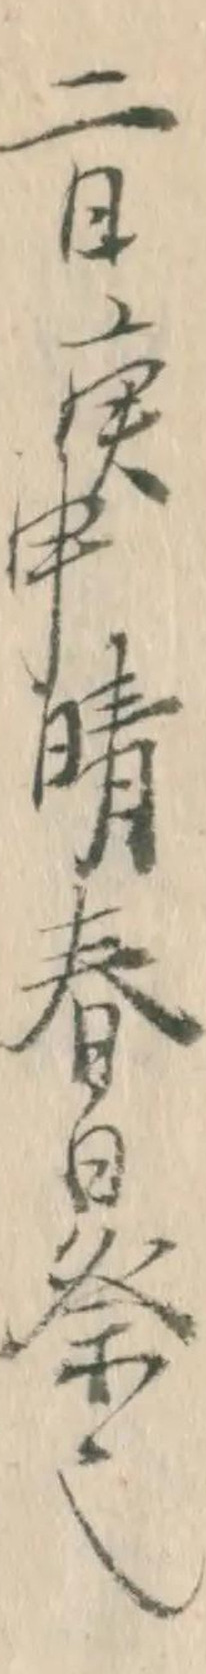二日庚申晴春日祭也
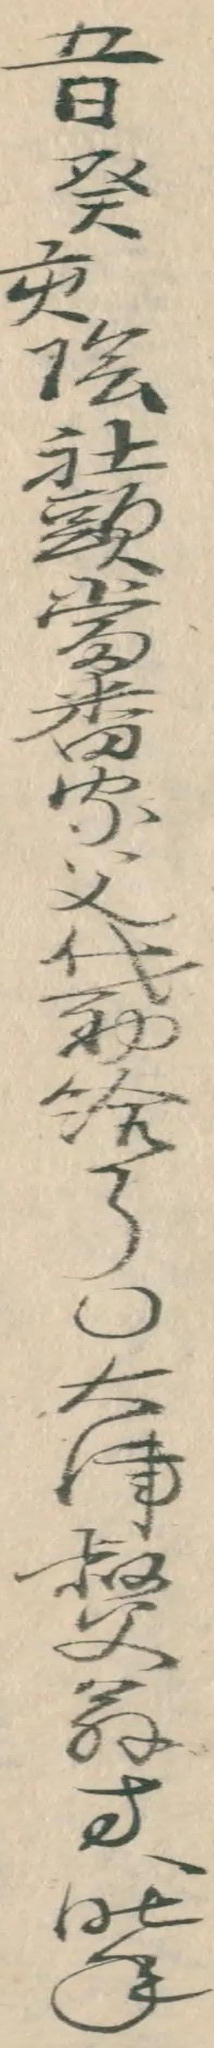五日癸亥陰社頭當番家父代勤給了〇大津叔父翁方へ昨年
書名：賀茂社記録. 第65冊
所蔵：国立国会図書館 National Diet Library, JAPAN
